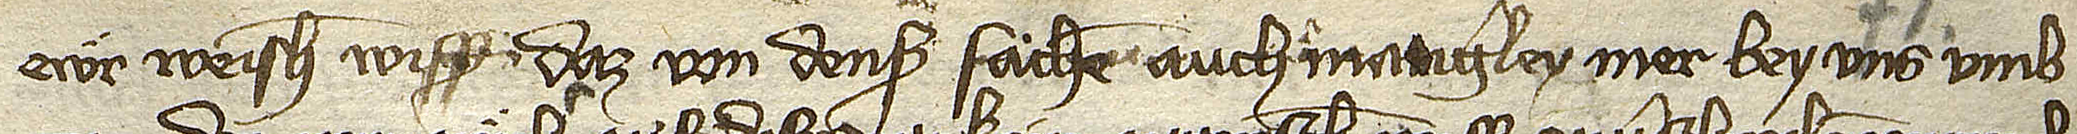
eẅr weiſh* wiſſ* . daʒ von denſ* ſache* auch mang*ley mer bey vns vmb
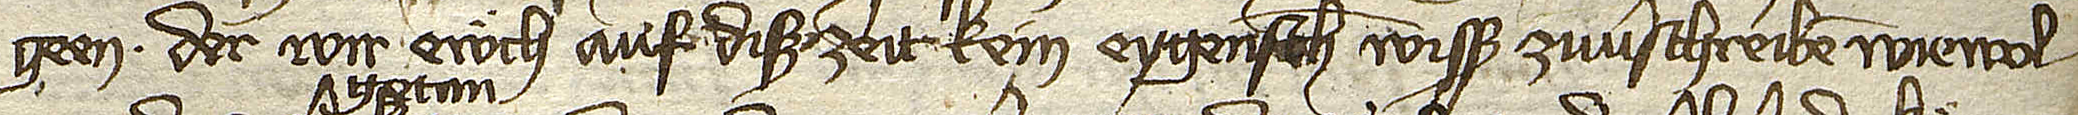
geen . der wir eẅch auf diſʒ ʒeit kein eygenſch* wiſſ* ʒuu*ſchreibe* wiewol
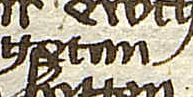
getan
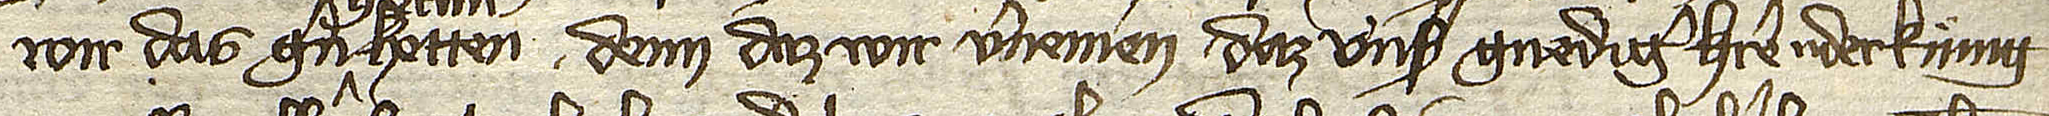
wir das g*n hetten / denn daʒ wir v*nemen / daʒ vnſ* gnedig* h*re ~ der künig
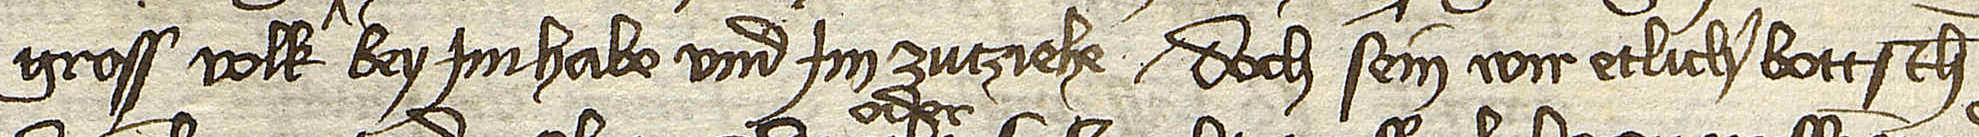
groſſ volk bey Im habe vnd Im ʒucʒiehe / Doch ſein wir etlich* bottſch*
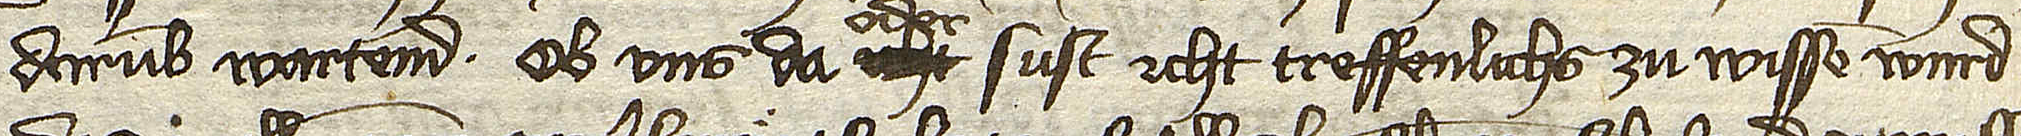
darub* wartend . Ob vns da icht ſuſt icht treffenlichs ʒu wiſſe* wurd
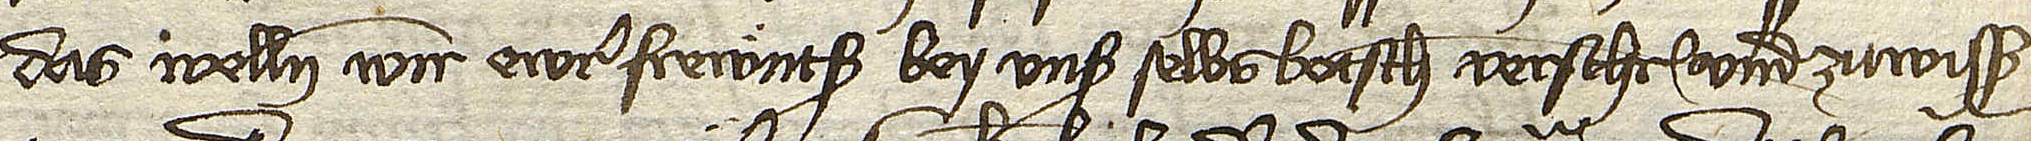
/ Das welln* wir ewr* freẅntſ* bey vnſ* ſelbs botſch* verſchr* vnd ʒu wiſſ*
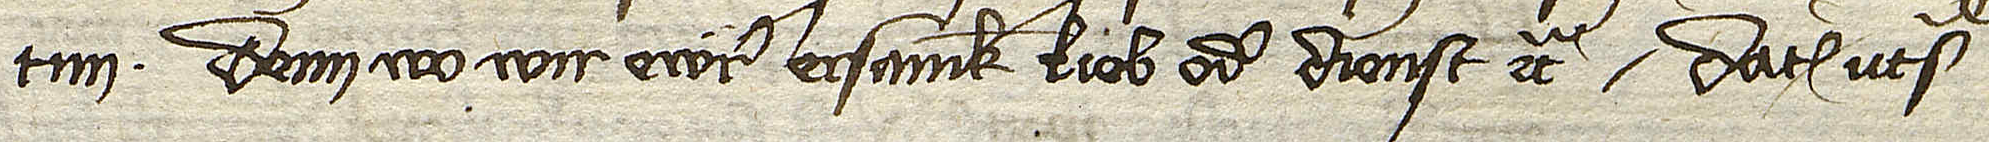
tun . Denn wo wir eẅr* erſamk* lieb od* dienſt ec* / Dat* ut ſ*
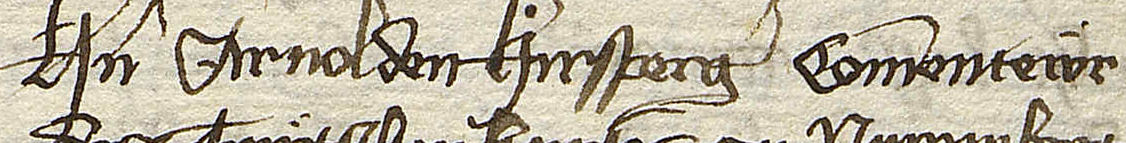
Hn* Arnolden Hirſperg* Com*enteẅr
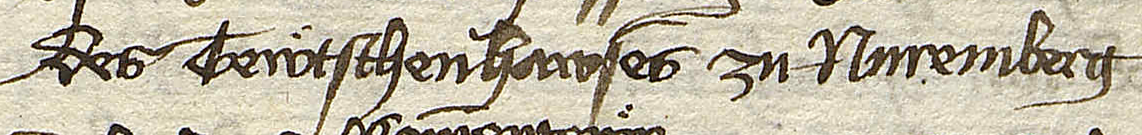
des Teẅtſchenhawſes ʒu Nuremberg
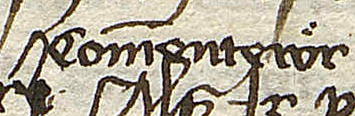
Com*enteẅr
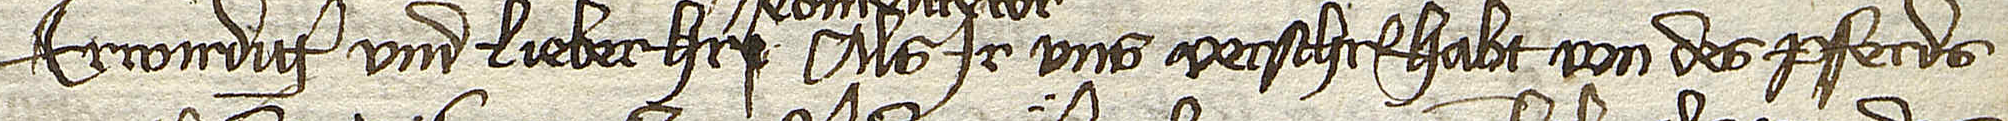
Erwirdig* vnd lieber h*re Als Ir vns verſchr* habt von des Pferds
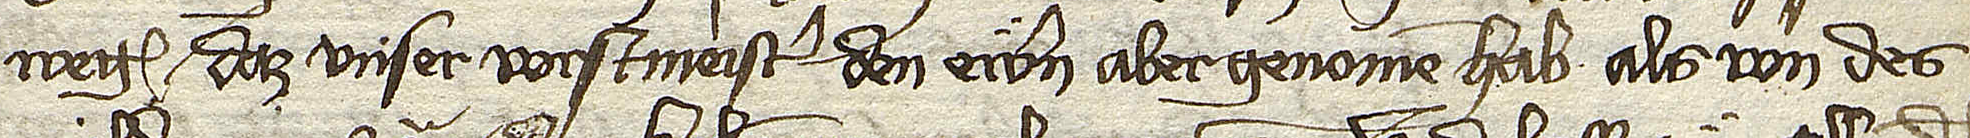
weg* / daʒ vnſer vorſtmeiſt* den eẅ*n aber genome* hab . als von des
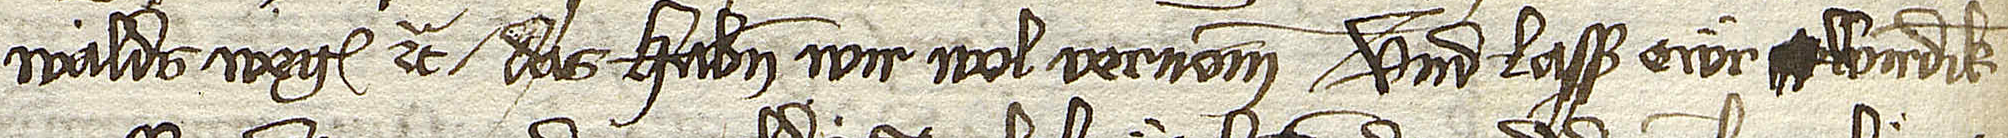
walds weg* ec* / das habn* wir wol vernom* / Vnd laſſ* eẅr %% wirdik*
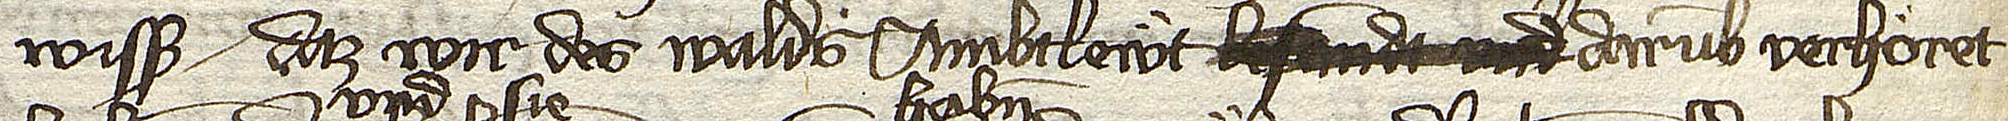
wiſſ* / daʒ wir des walds Ambtleẅt beſandt vnd darub* verhöret
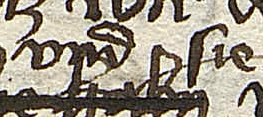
vnd ſie
